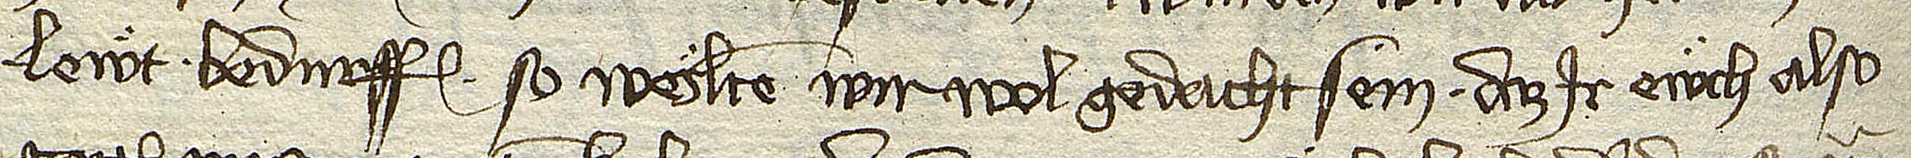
leẅt . bedurff* . ſo wölte* wir wol gedacht ſein . daʒ Ir eẅch alſo
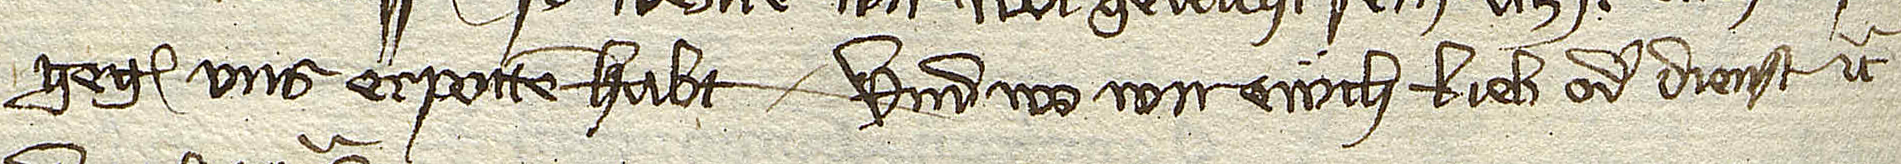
geg* vns erpotte* habt / Vnd wo wir eẅch lieb od* dienſt ec*
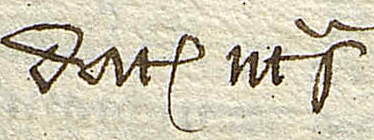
Dat* ut ſ*
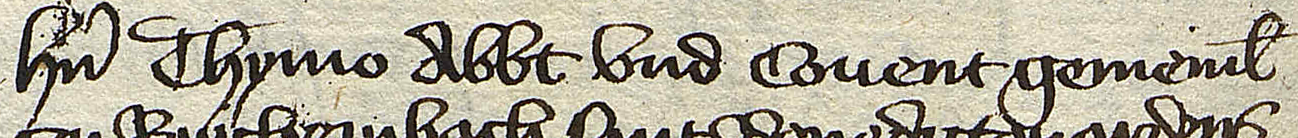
h*n Thymo Abbt vnd Couent gemeinl*
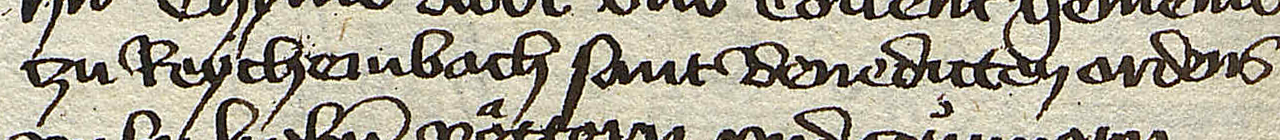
cʒu Reychembach ſant Beneditten ordens
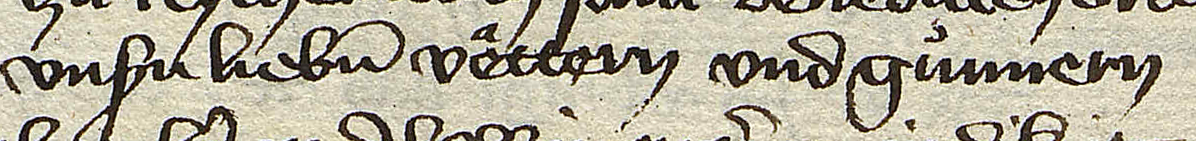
vnſ*n lieb*n vëttern vnd günnern
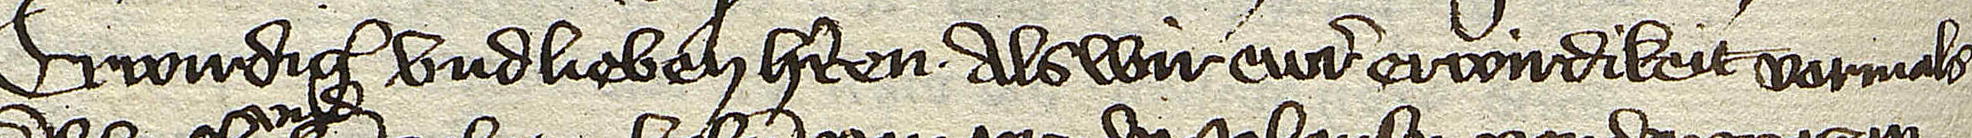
Erwirdig* vnd lieben h*ren . Als wir ew*r erwirdikeit vormals
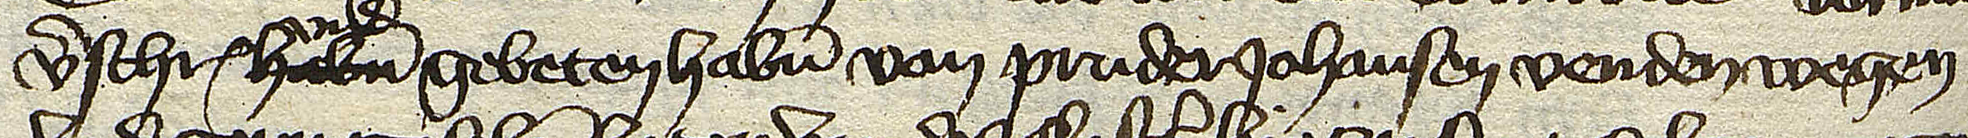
v*ſchr* hab*n gebeten hab*n von pruder Iohanſen venden wegen
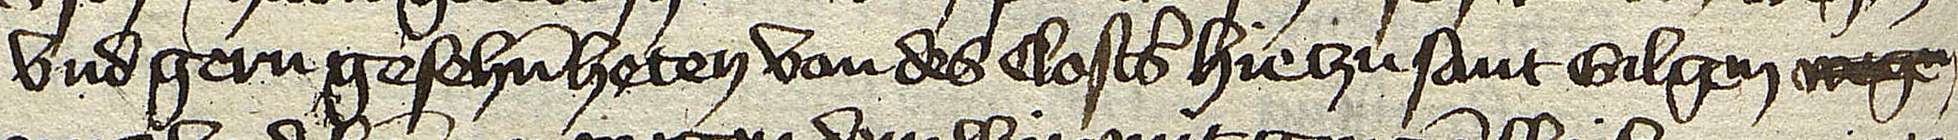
vnd gern geſehn* heten Von des Cloſt*s hie cʒu ſant Gilgen wegen
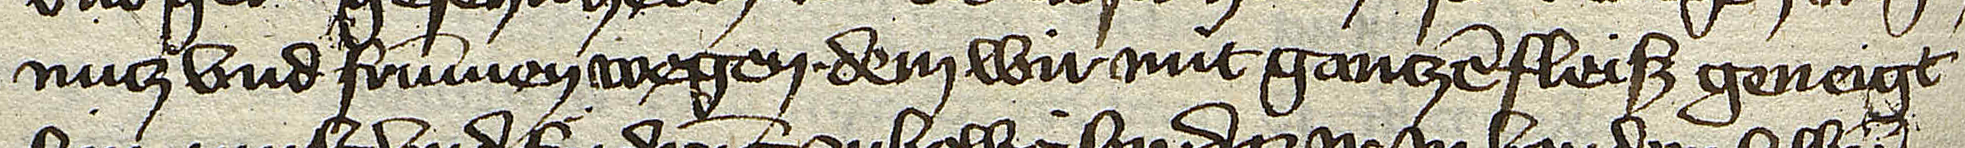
nucʒ vnd frumen* wegen . dem . wir mit gancʒe* fleiſʒ geneigt
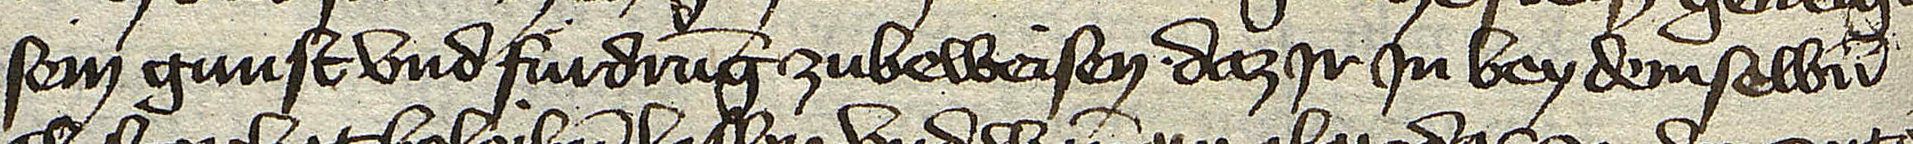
ſein gunſt vnd fürdru*g ʒu beweiſen . daʒ Ir In bey demſelb*n
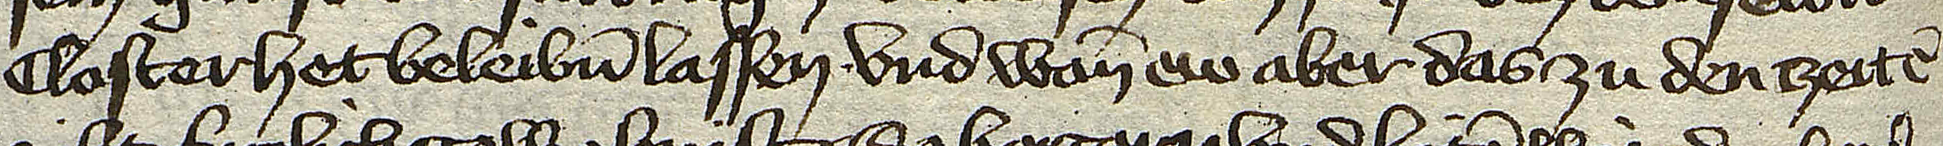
Closter het beleib*n laſſen . Vnd wan* ew aber das cʒu den cʒeite*
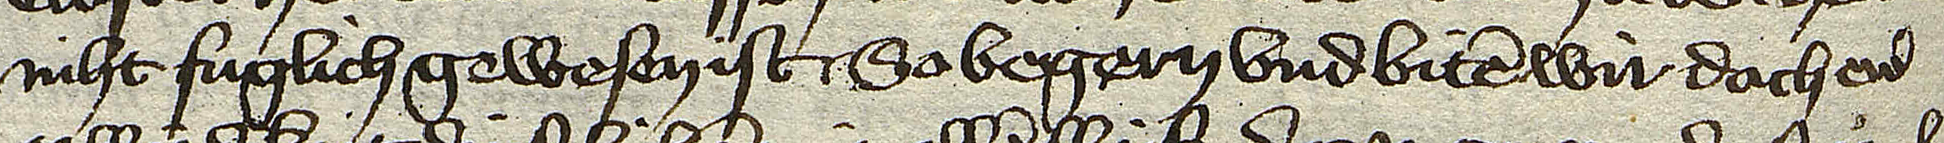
niht fuglich geweſen iſt / So begern Vnd bite* wir doch ew*
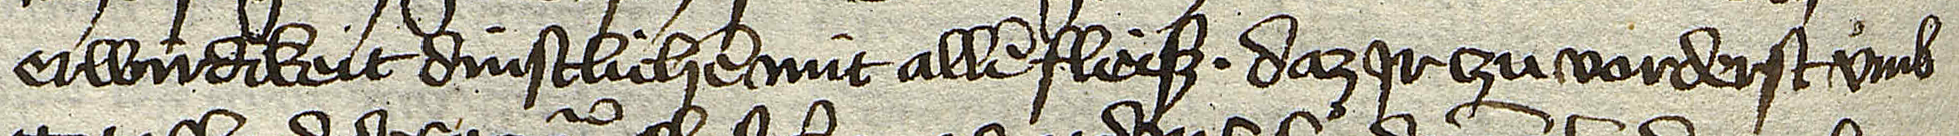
erwirdikeit dinſtlich* mit alle* fleiſʒ . daʒ Ir ʒu vorderſt v̈mb
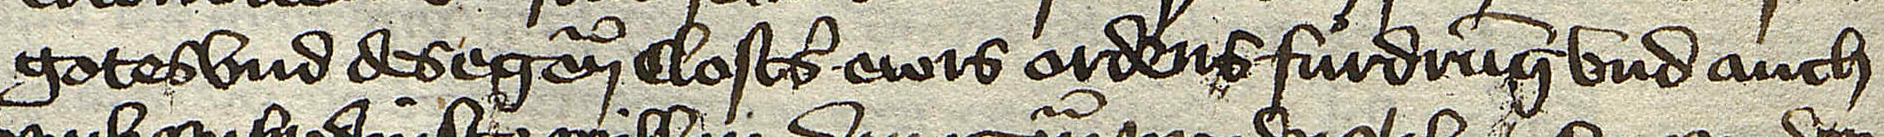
gotes Vnd des egen* Cloſt*s ewrs ordens fürdrug* vnd auch
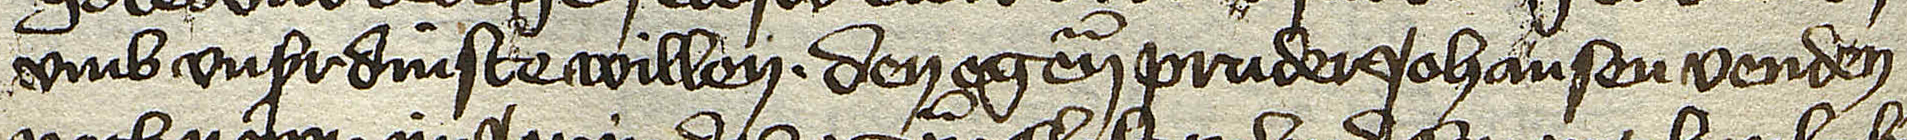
vmb vnſ*r dinſte willen . den egen* pruder Iohanſen venden
